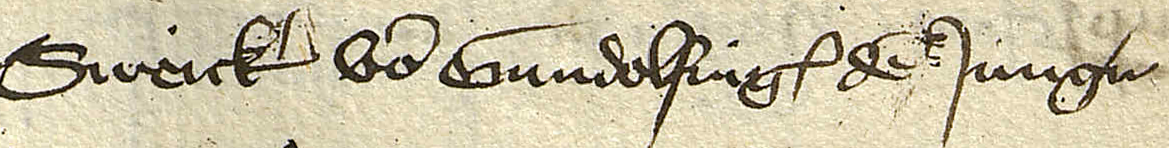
Sweick* vo* Gundolfing* d* Iungn*
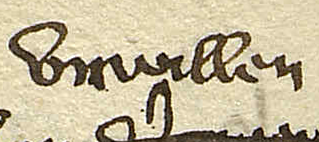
vnwillen
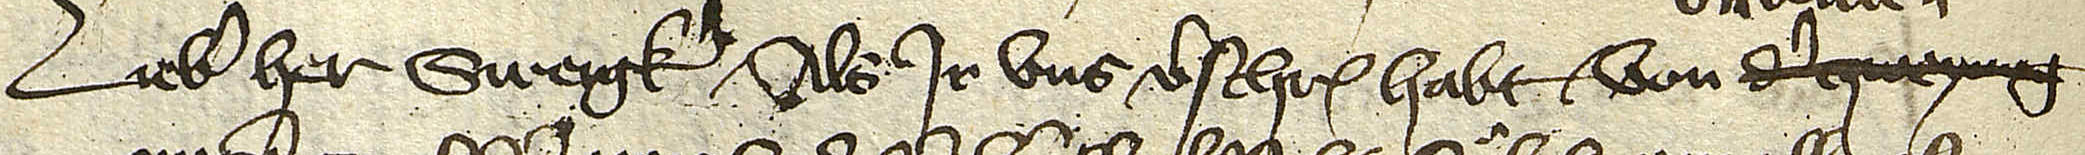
Lieb* her Sweigk* / Als Ir vns v*ſchr* habt / von d* cʒweyung
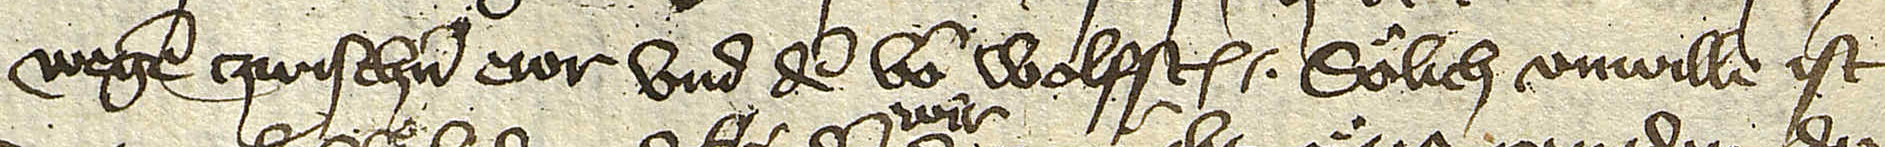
wege* cʒwiſchn* ewr vnd d* vo* wolfſt* / . Sölich vnwille iſt
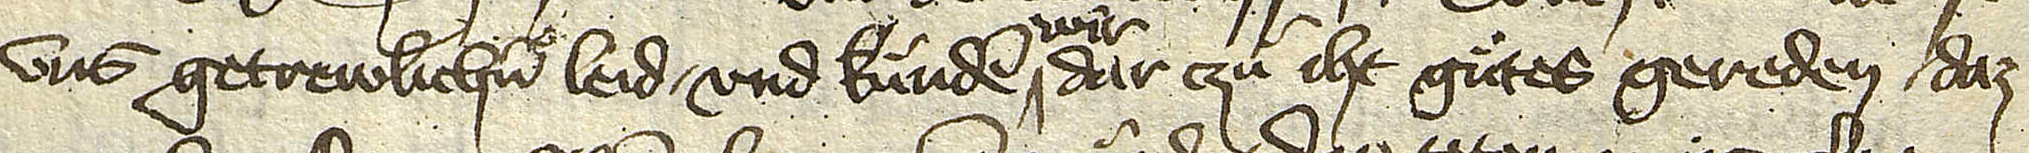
vns getrewlichn* leid / vnd künde* dar cʒü iht gütes gereden / daʒ
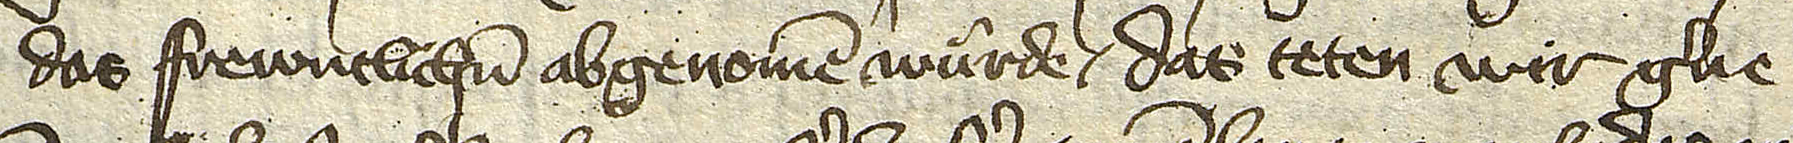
das frewntlichn* abgenome* würde / das teten wir g*ne
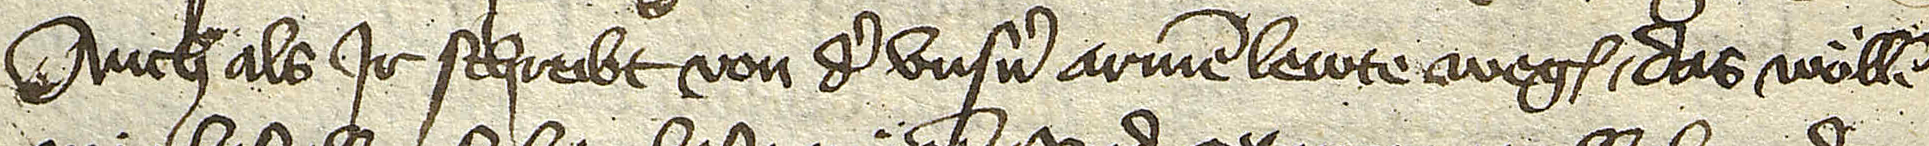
Auch als Ir ſchreibt von d* vnſn* arme* lewte weg* / das wölle*
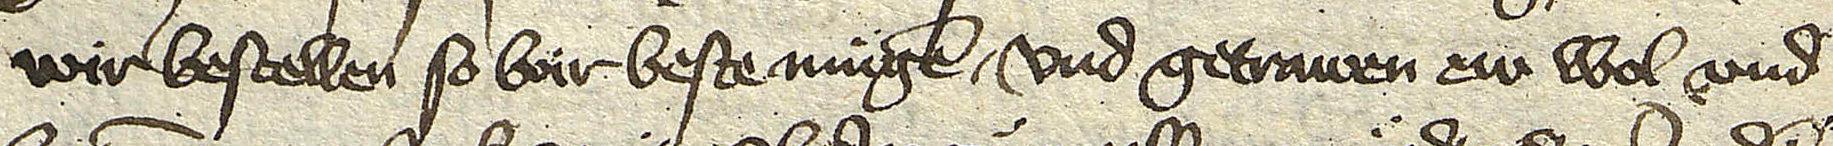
wir beſtellen ſo wir beſte müge* / vnd getrawen ew wol vnd
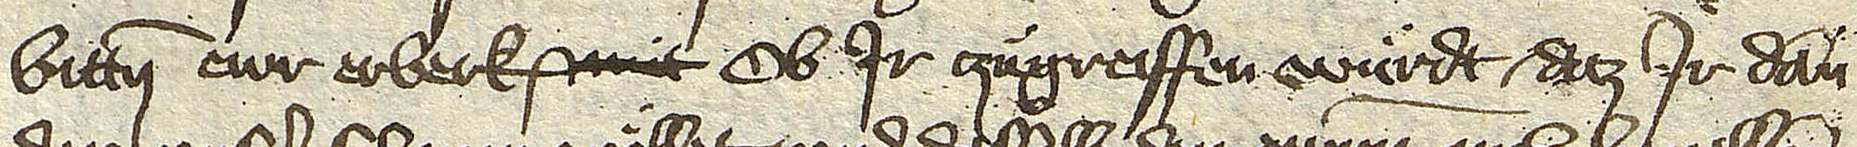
bittn* ewr erberk* mit Ob Ir cʒügreiffen würdt / daʒ Ir dan*
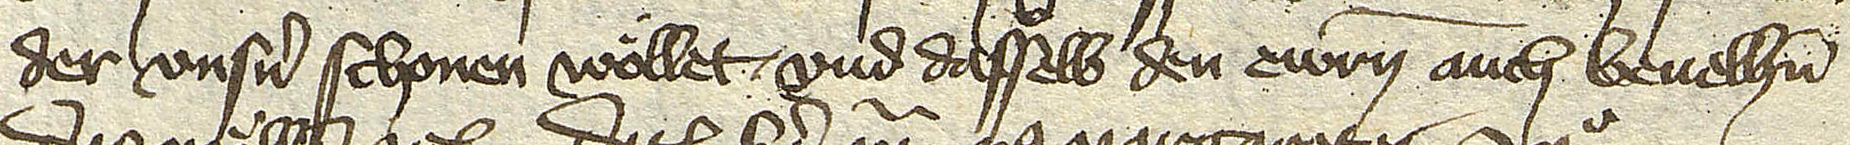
der vnſn* ſchonen wöllet / vnd daſſelb den ewrn* auch beuelhn*
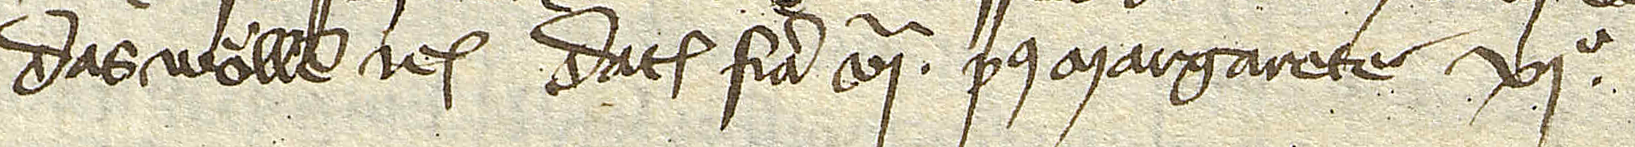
Das wölle* ec* Dat* fia* vi* . p* Margarete* xi*.
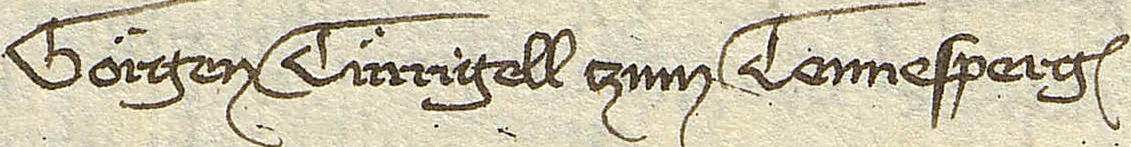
Görgen Türrigell cʒum Tenneſperg*
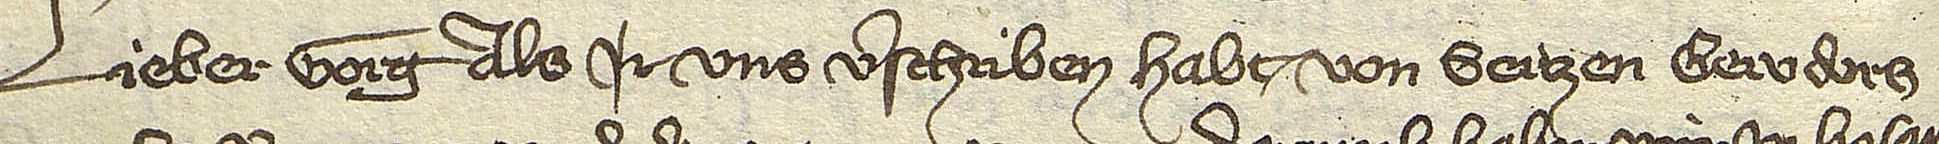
Lieber Gorg Als Ir vns v*ſchriben habt / von Seicʒen Gewders
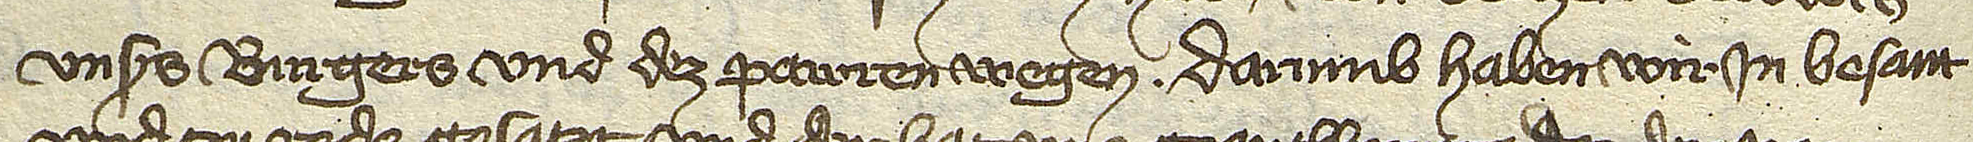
vnſ*s Burgers vnd deʒ pawren wegen . Darumb haben wir In beſant
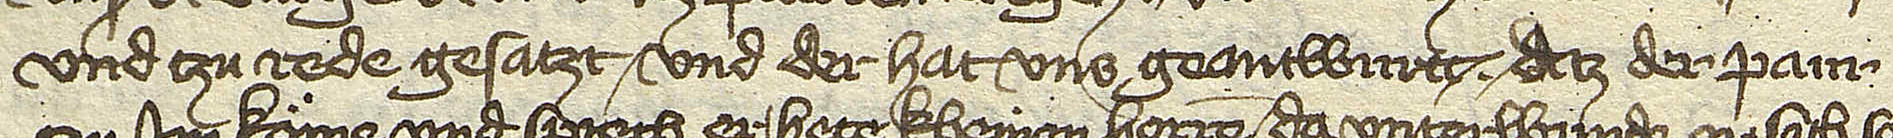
vnd cʒu rede geſacʒt / vnd der hat vns geantwurtt / . daʒ der paur
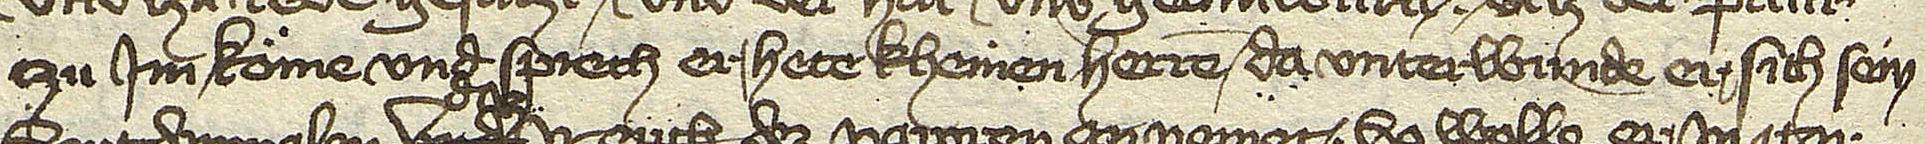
cʒu Im köme vnd ſprech er hete kheinen herre / da vnterwinde er ſich ſein
